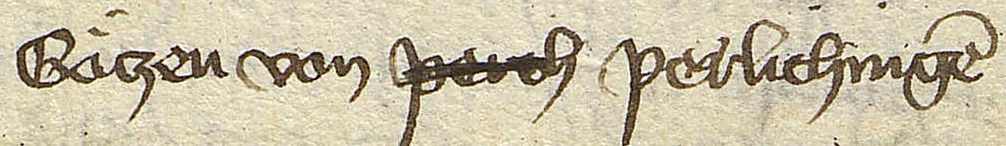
Göcʒen von Perch Perlichinge*
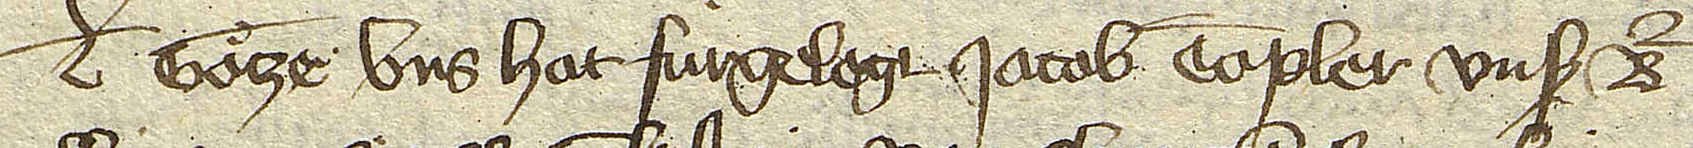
L* Göcʒe vns hat fürgelegt Iacob Topler vnſ* B*
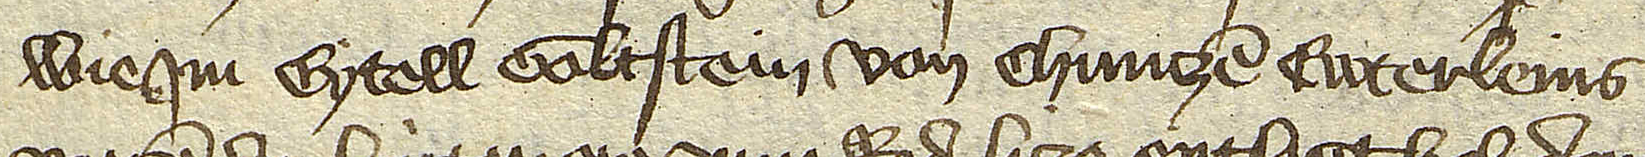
wie Im Eytell Goltſtein von Chuncʒe* Ewterleins
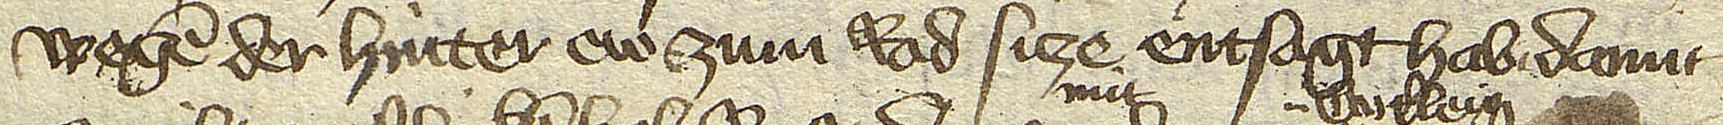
wege* der hinter ew cʒum Rad ſicʒe entſagt hab / damit
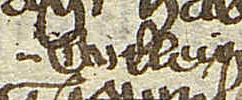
~ Ewt*lein
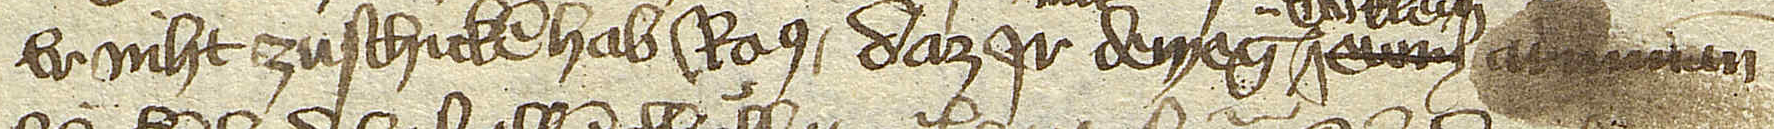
Er niht cʒuſchicke* hab Ro* / daʒ Ir dem eg* ewm* armman*
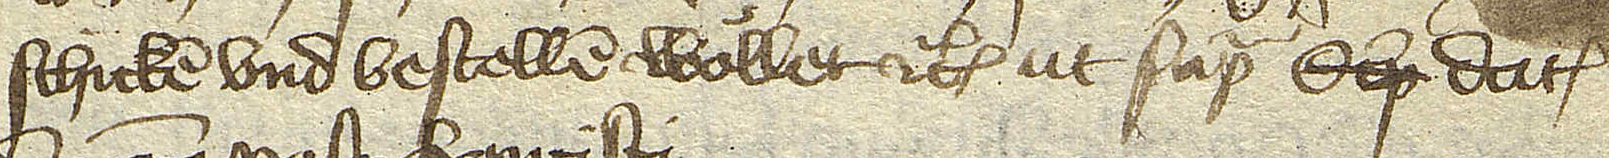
ſchicke* vnd beſtelle* wöllet ec* ut ſup* Scp* dat*
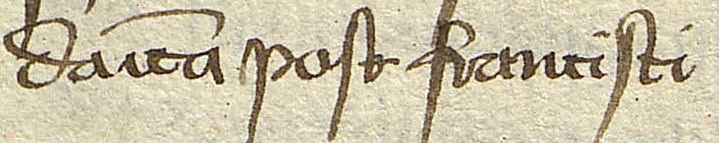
doica* poſt franciſci
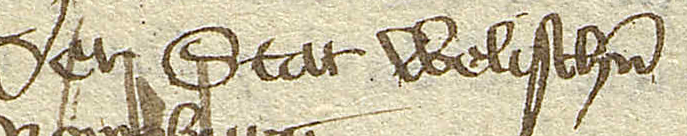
Der Stat Weliſchn*
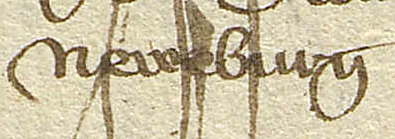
Neweburg
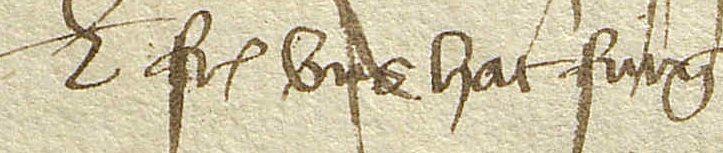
L* fr* vns hat furg*
